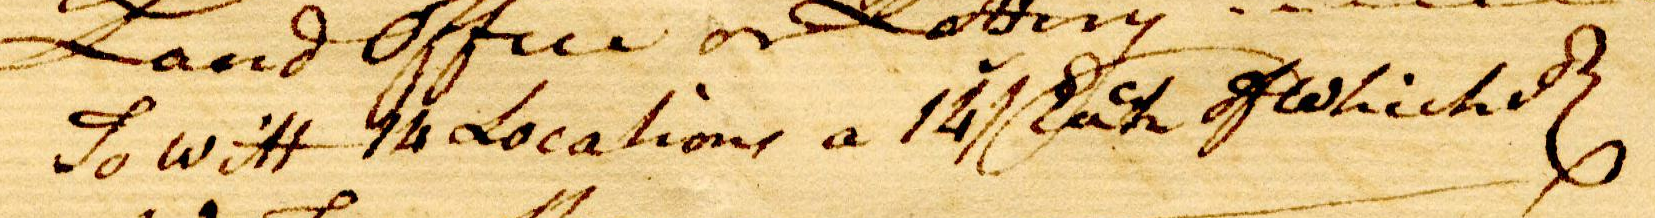To witt 14 Locations a 14s Each of wchih I
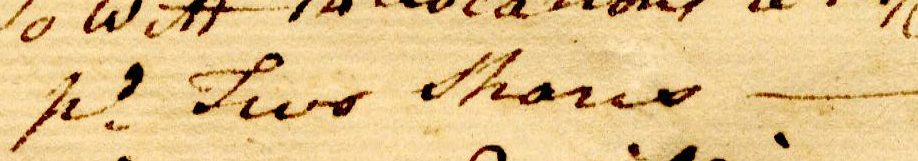p^d. Two shares
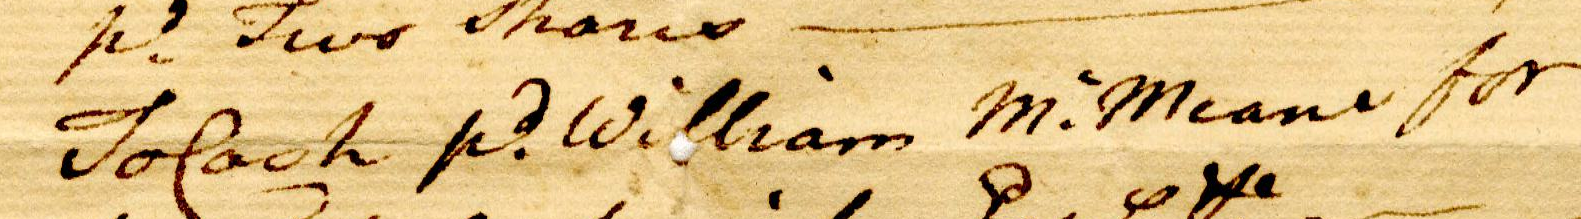To Cash p^d. William M^c.Means for
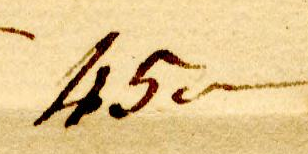45-
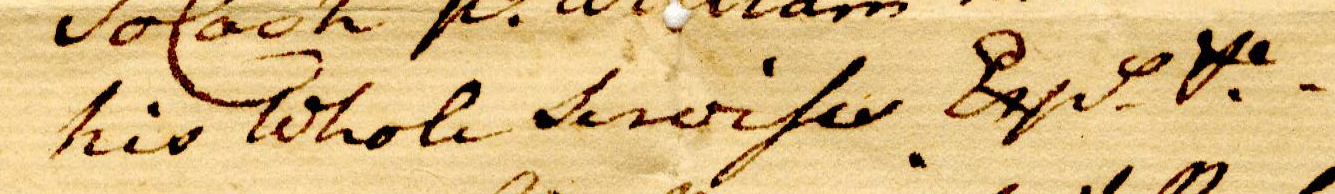his whole servisce Exp^s &^c.
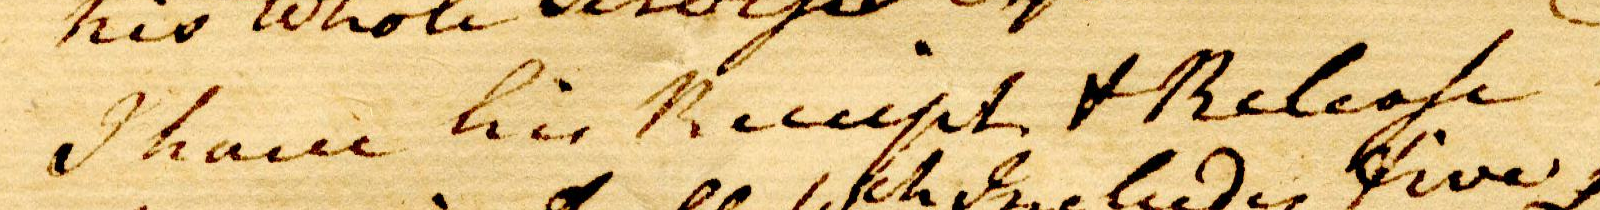I have his Receipt & Release
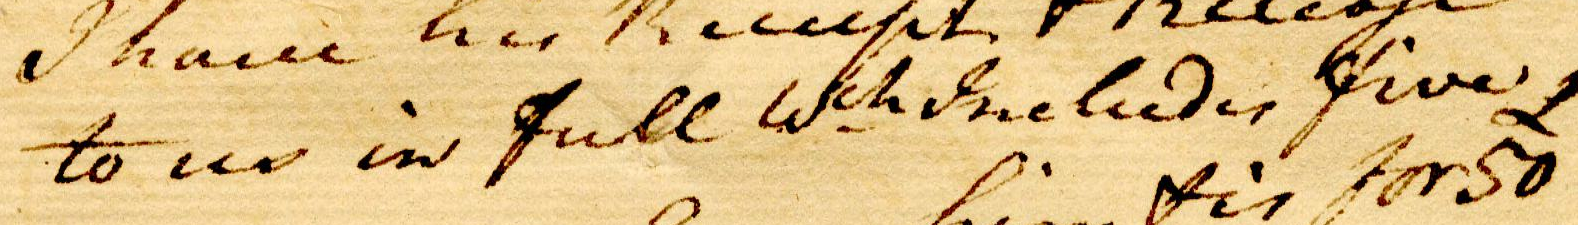to us in full w^ch. Includes five
